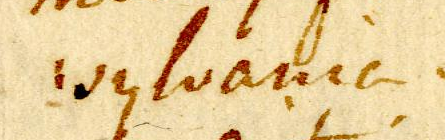-sylvania
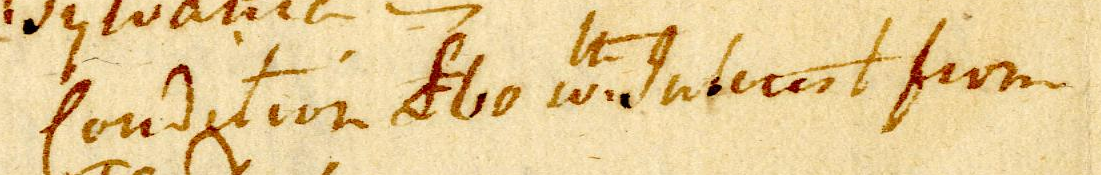Condition £60 w^th. Interest from
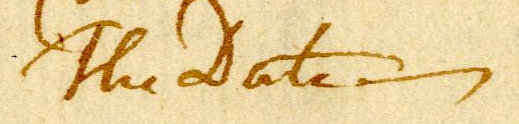the Date.
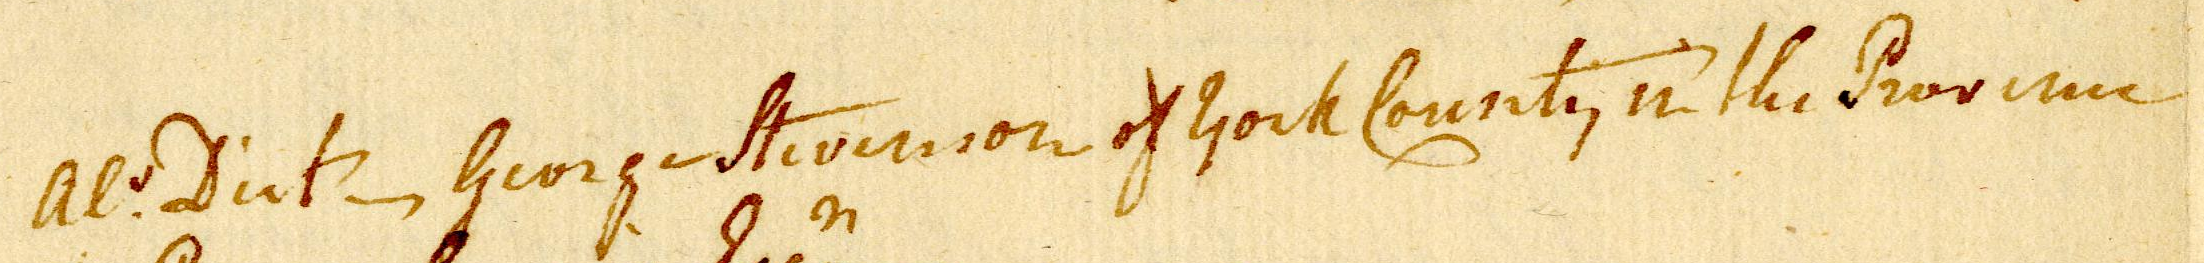Al^t. Dist- George Stevenson of York County in the Province
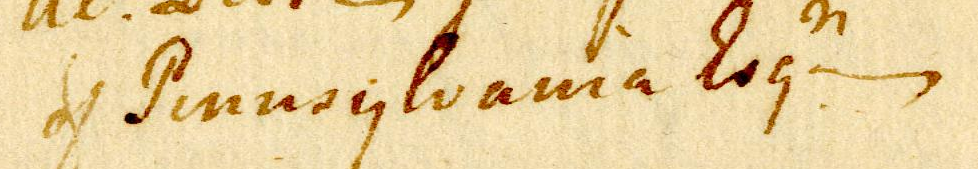of Pennsylvania Esq^r
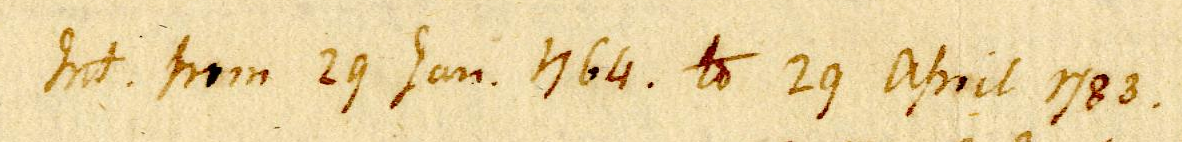Int. from 29 Jan. 1764. to 29 April 1783.
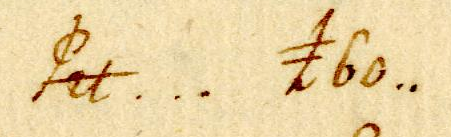Pet... £60..
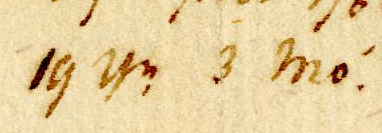19 Y^r. 3 Mo.
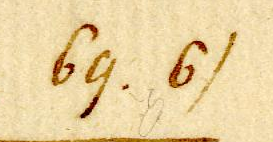69. 6s
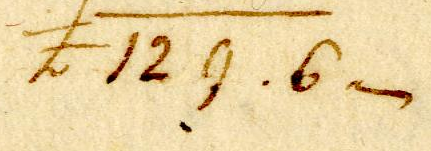£129. 6
